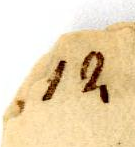12
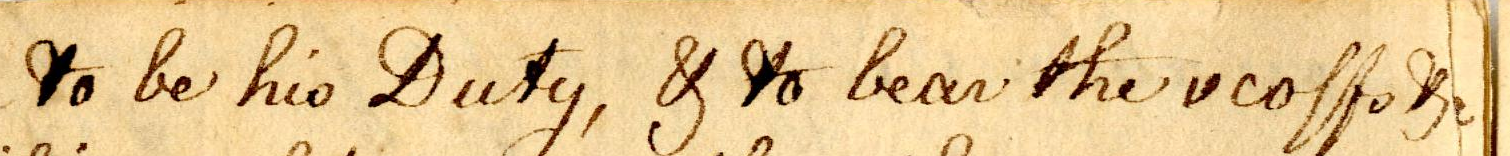to be his Duty, & to bear the scoffs &
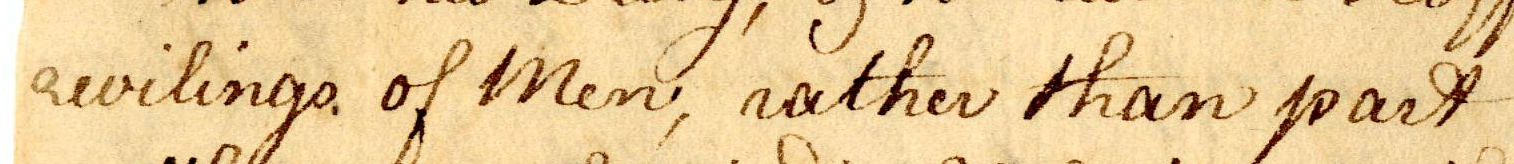revilings of Men, rather than part
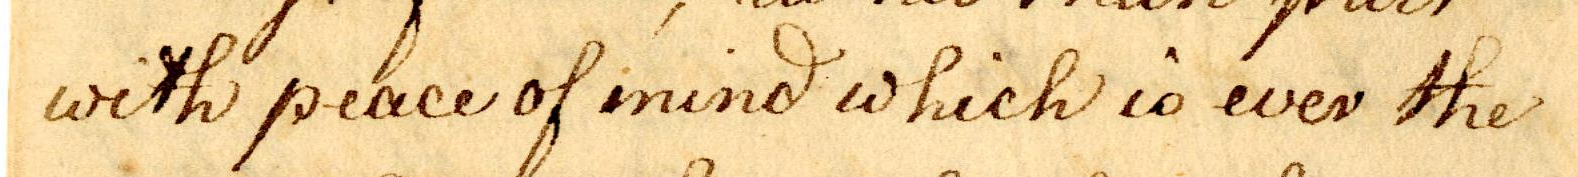with peace of mind which is ever the
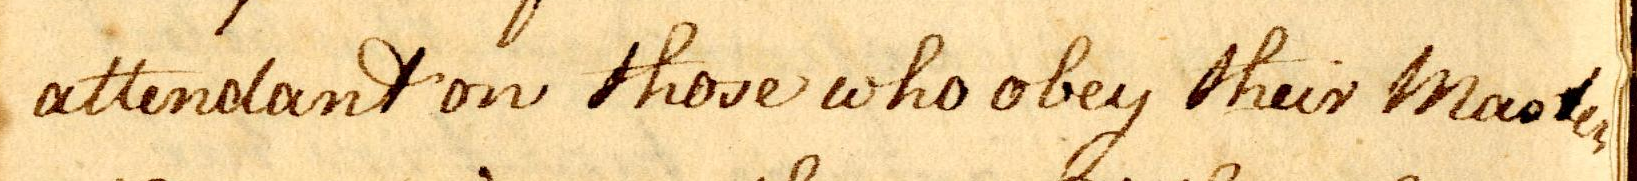attendant on those who obey their Master
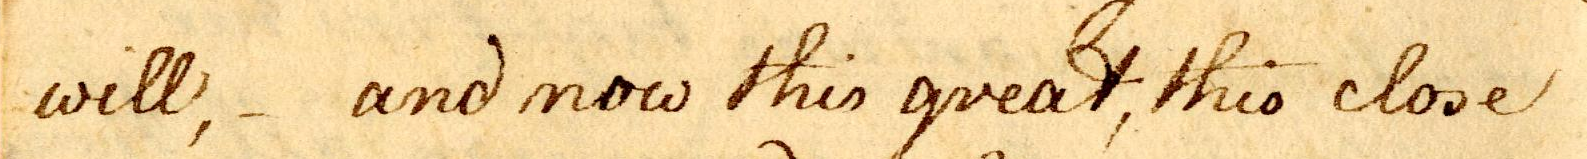will- and now this great, this close
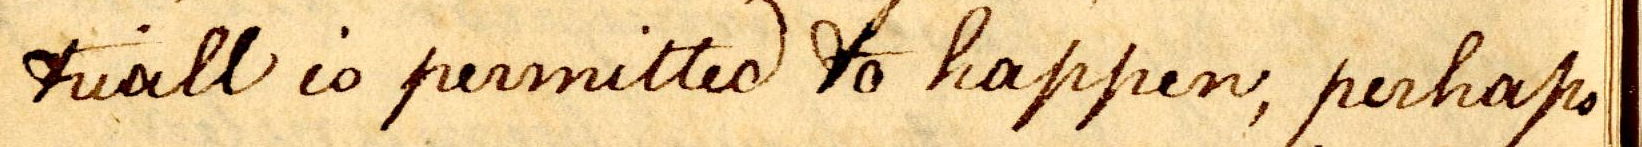triall is permitted to happen, perhaps
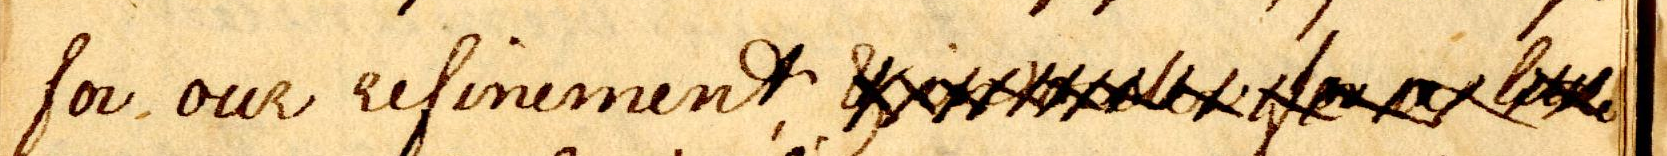for our refinement [& ________ for a little]
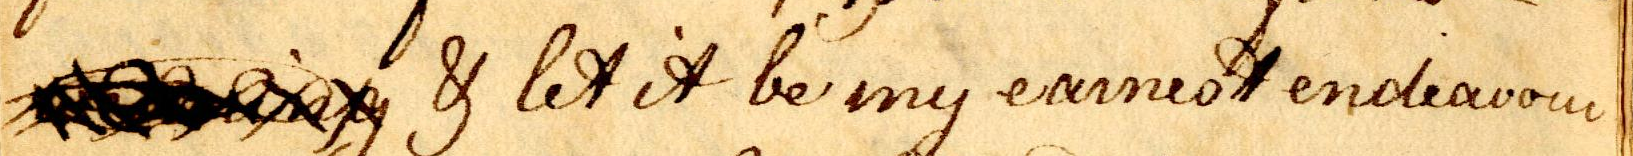[_____] & let it be my earnest endeavour
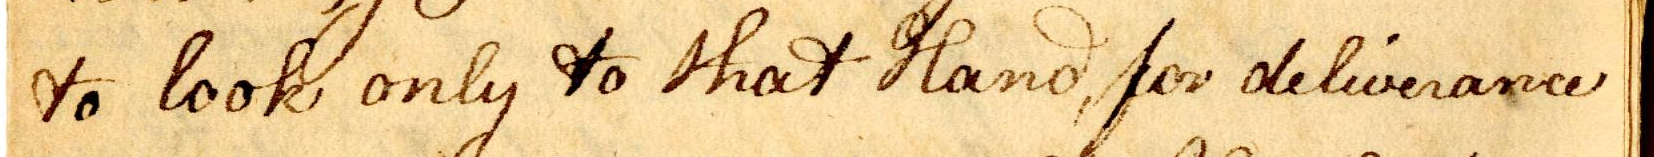to look only to that Hand for deliverance
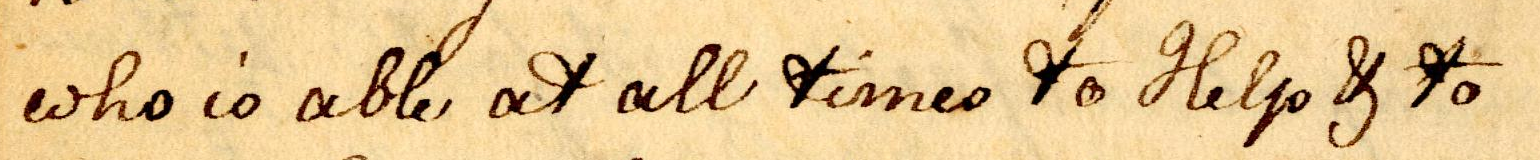who is able at all times to Help & to
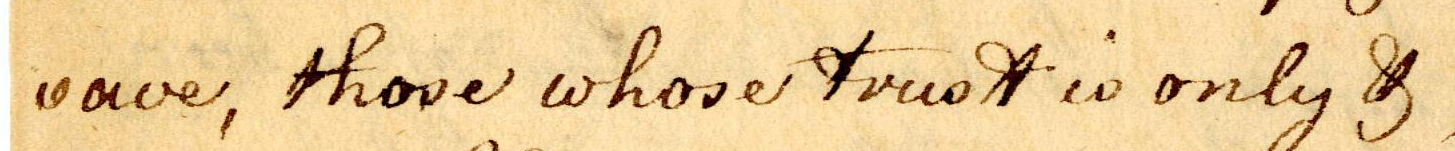save, those whose trust is only &
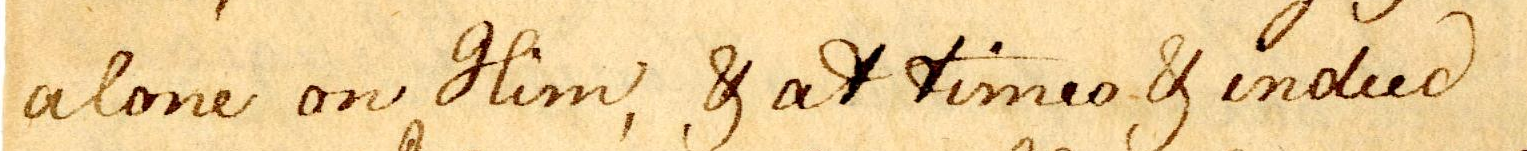alone on Him, & at times & indeed
